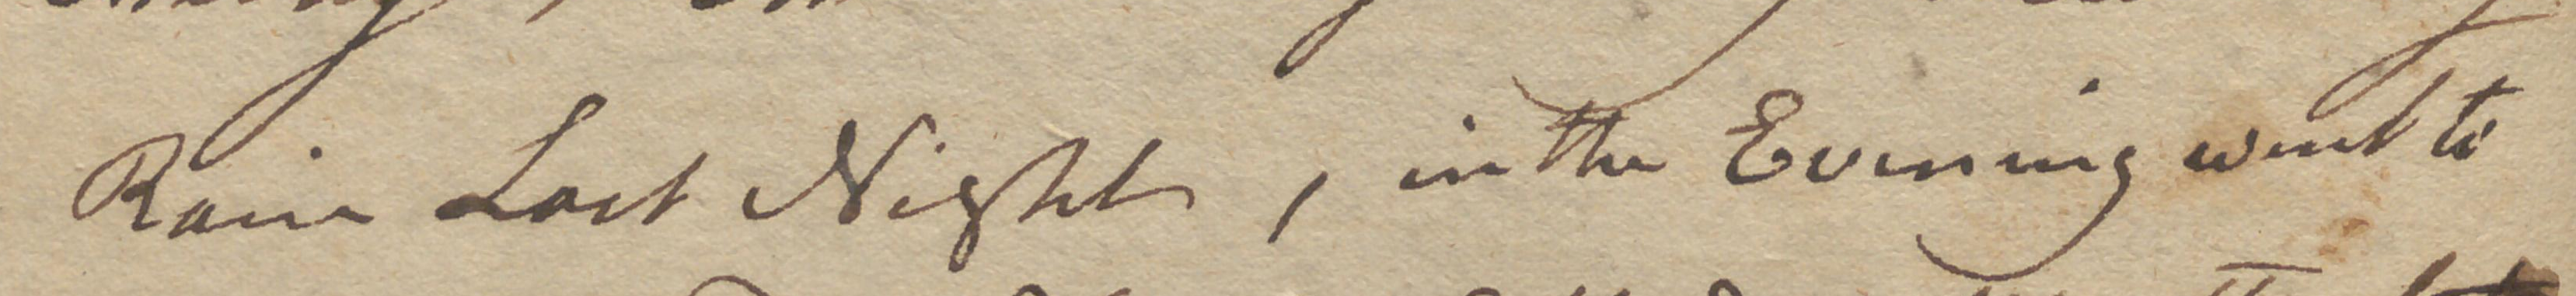Rain Last Night, in the Evening went to
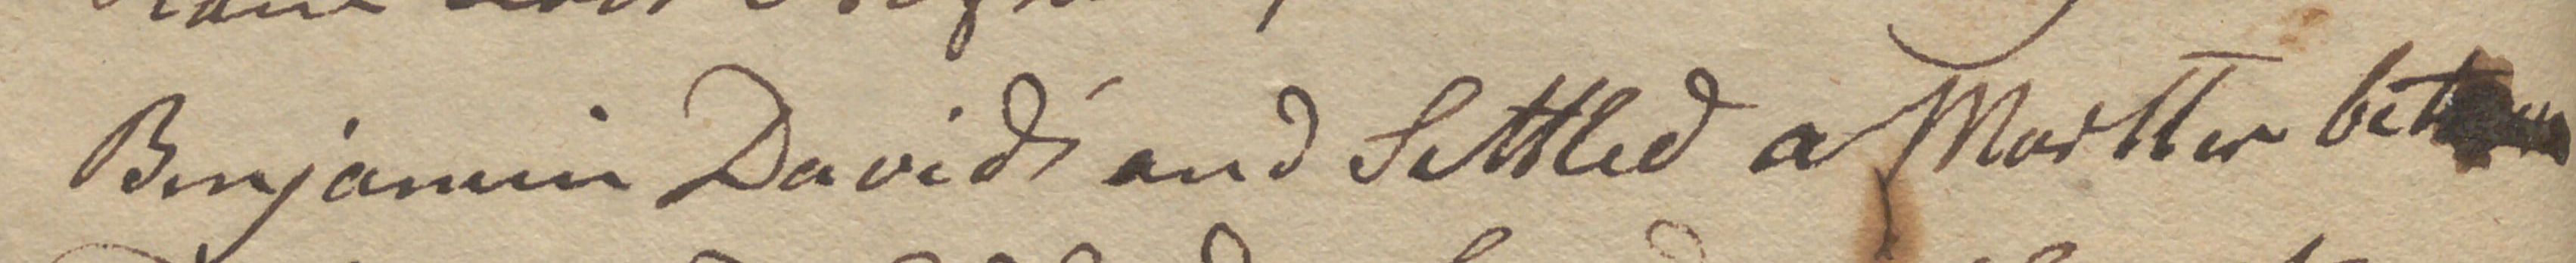Benjamin David's and Settled a Martyer between
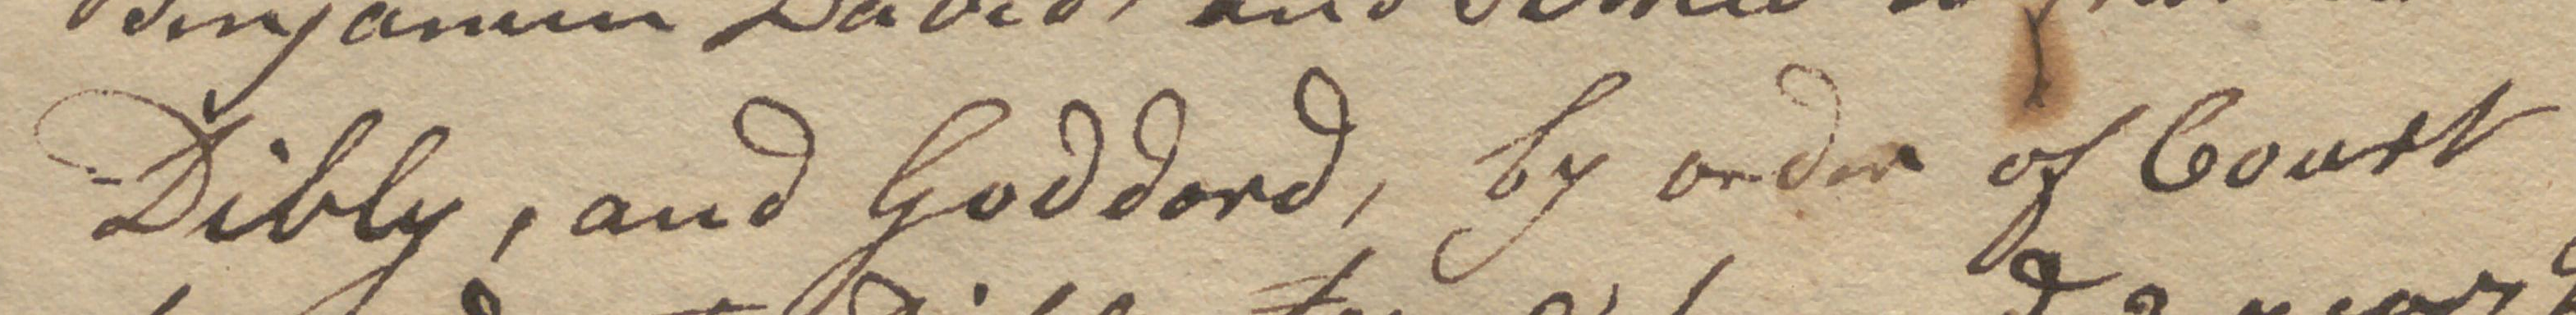Dibly, and Goddard, by order of Court
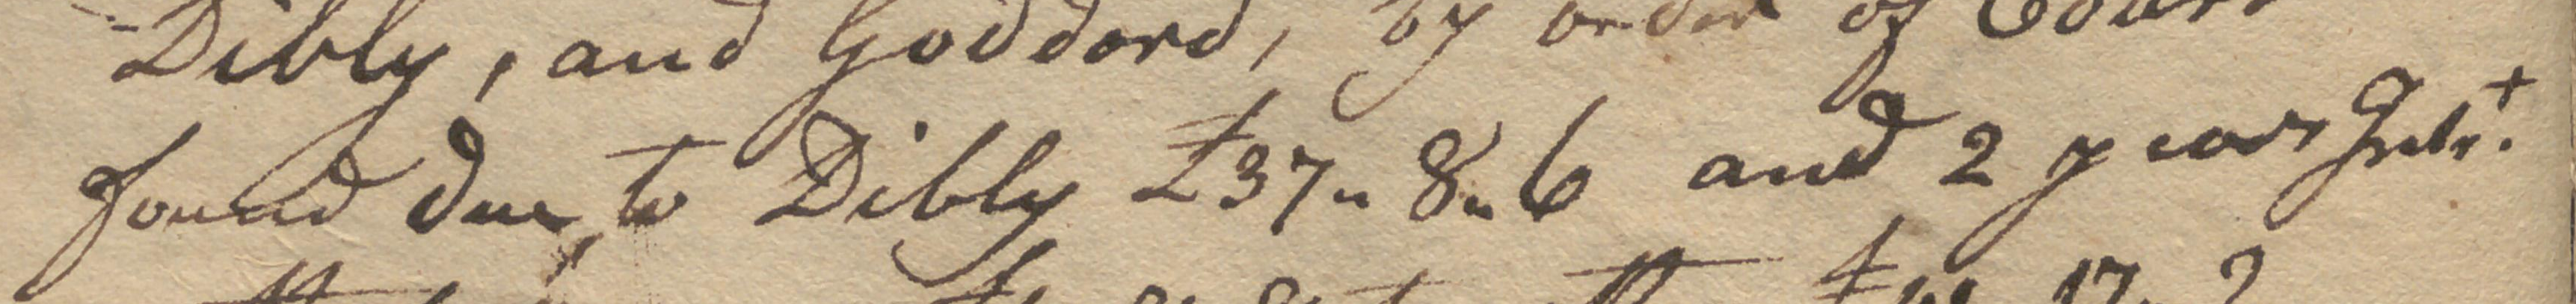found due to Dibly £37..8..6 and 2 gears Intr^t.
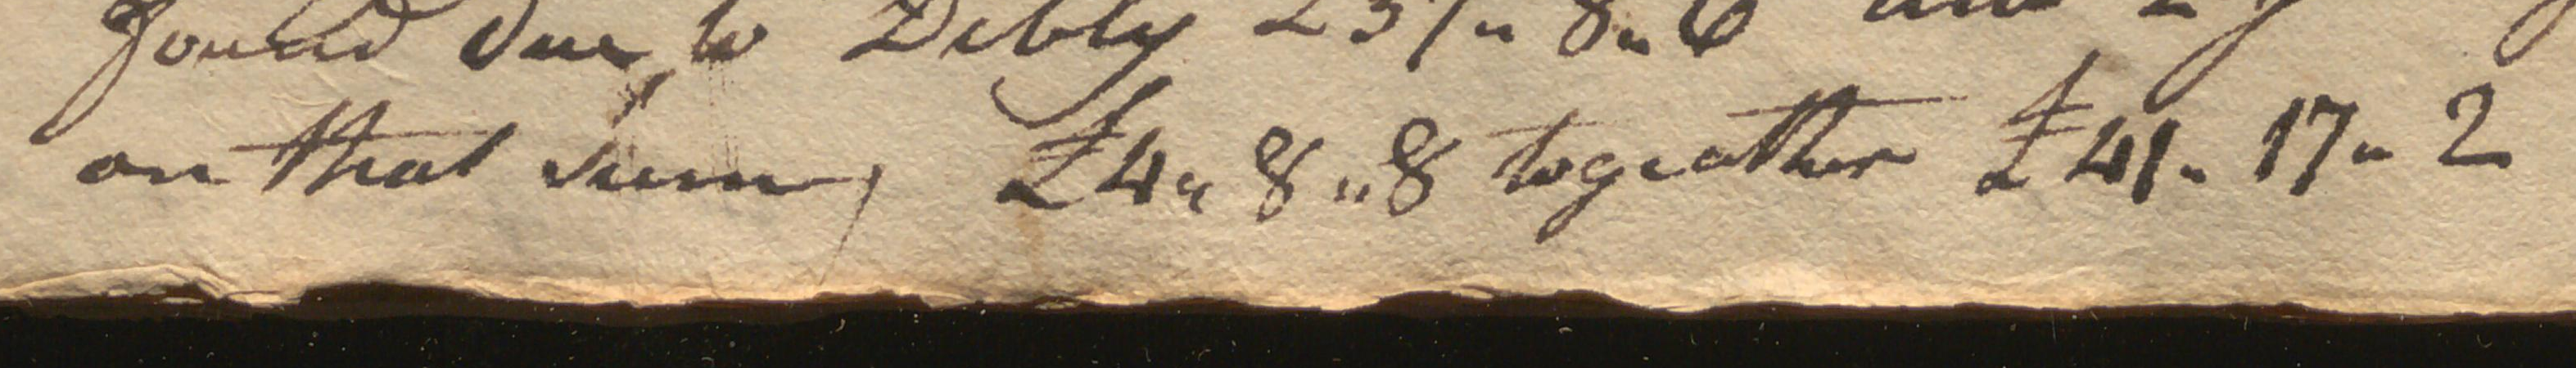on that sum, £4..8..8 togesthr £41.17.2
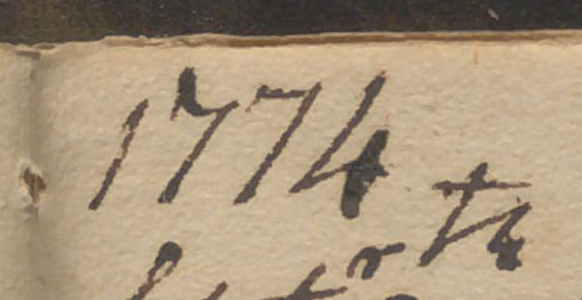1774
